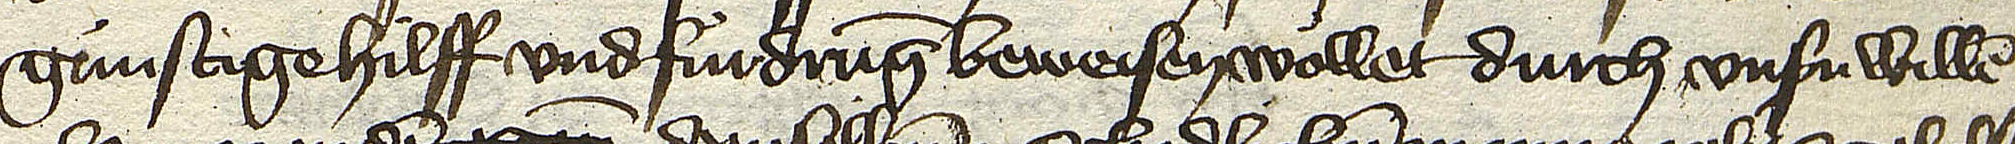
günſtige hilff vnd fürdru*g beweiſen wöllet durch vnſ*n wille*
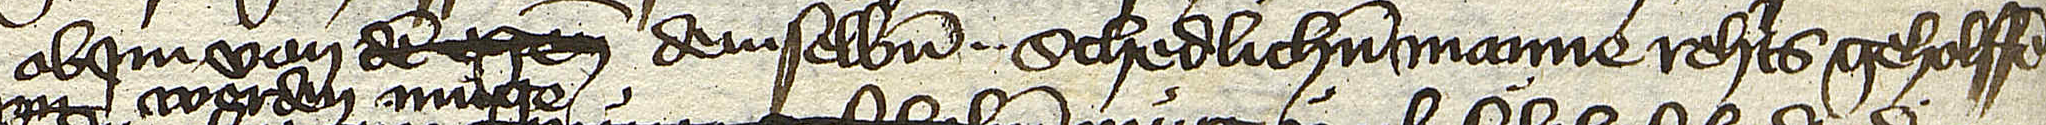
ob Im von de* egen* demſelb*n ~ Schedlich*n manne rehts geholffe*
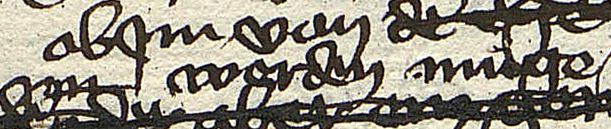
%% werden müge
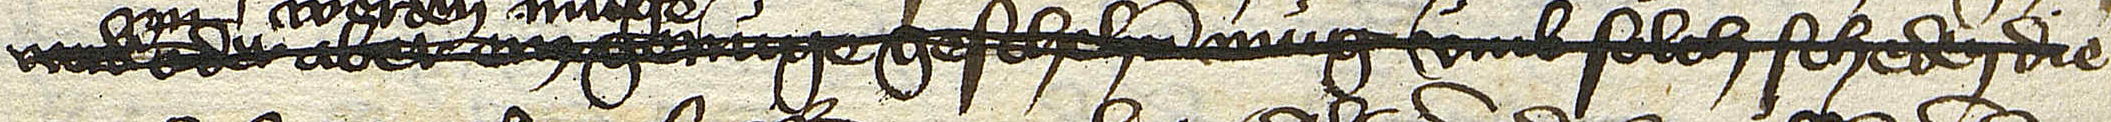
werde* oder aber ein genüge geſcheh*n müg v̈mb ſölch ſcheden die
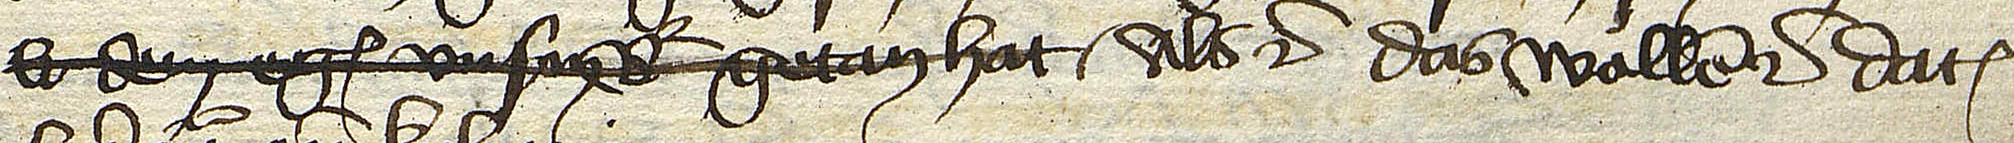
Er dem eg* vnſ*m B* getan hat / Als ec* das wölle* ec* dat*
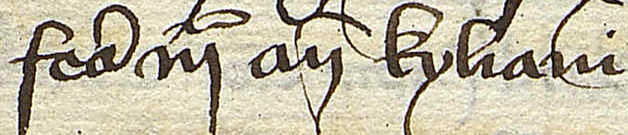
fea* iii* an kyliani
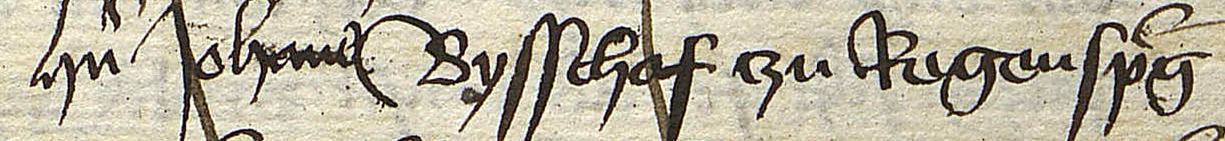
H*n Iohan Byſſchof cʒu Regenſp*g
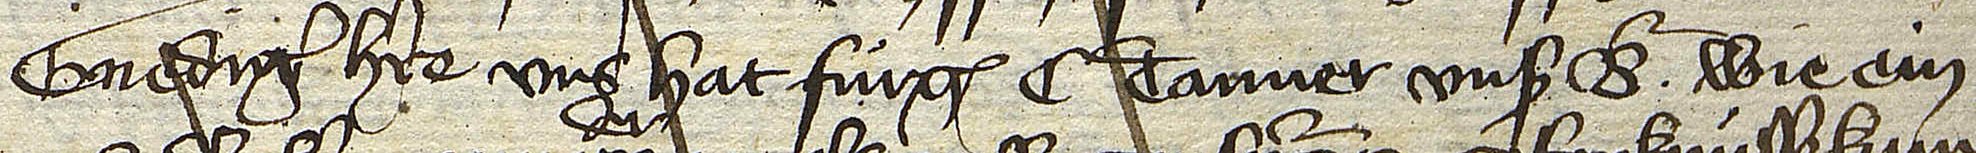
Gnedig* h*re vns hat fürg* C Tanner vnſ* B* . wie ein
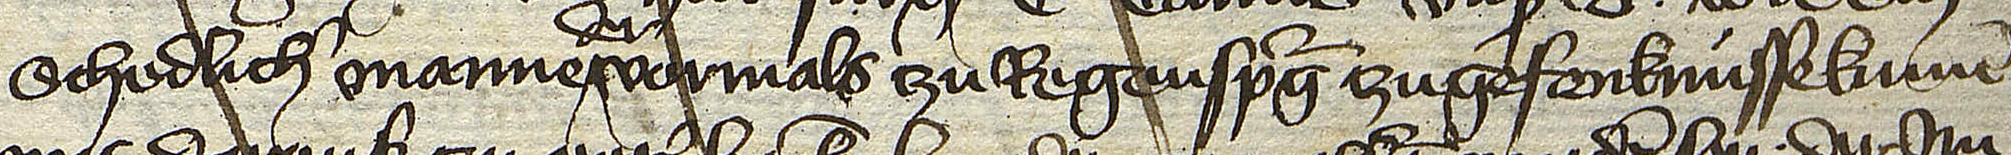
Schedlich* manne vormals cʒu Regenſp*g cʒugefenknüſſe kume*
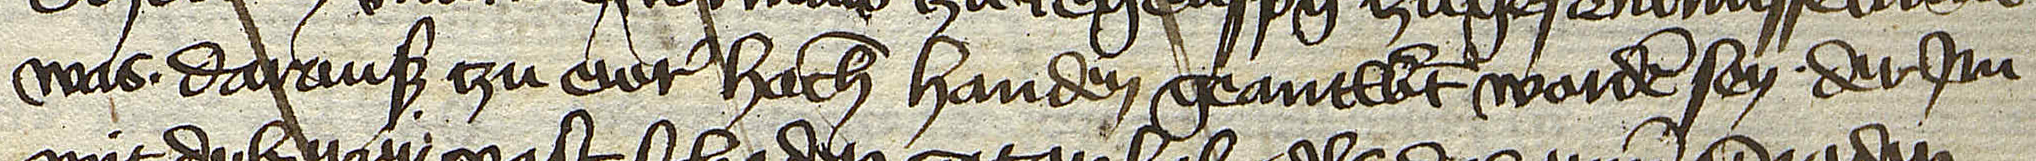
was . darauſʒ cʒu ew*r hoch* handen geantw*t worde* ſey . der Im
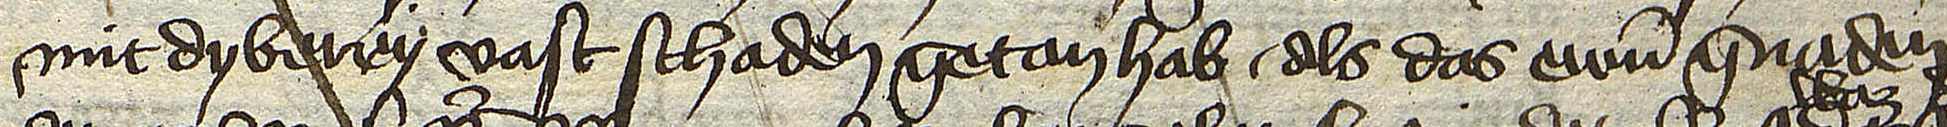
mit dyberey vaſt ſchaden getan hab / Als das ew*n gnaden
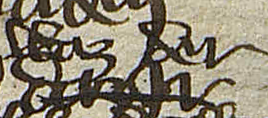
waʒ der
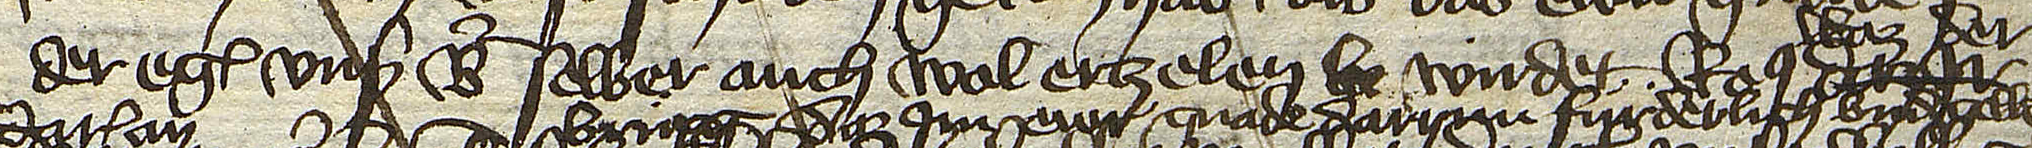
der eg* vnſ* B* ſelber auch wol ercʒelen be wirdet .. Ro* daʒ Ir
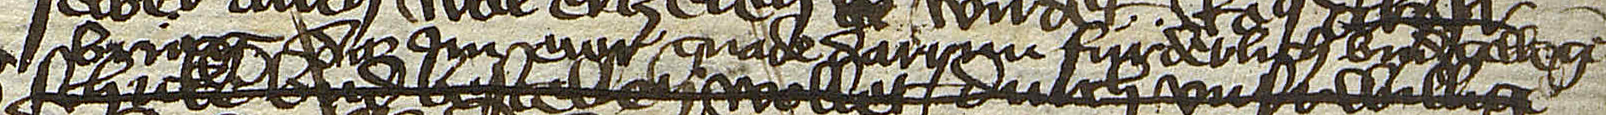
bring daʒ Im ewr gnade darynn fürderlich vnd gewege*
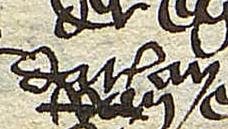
dar* an
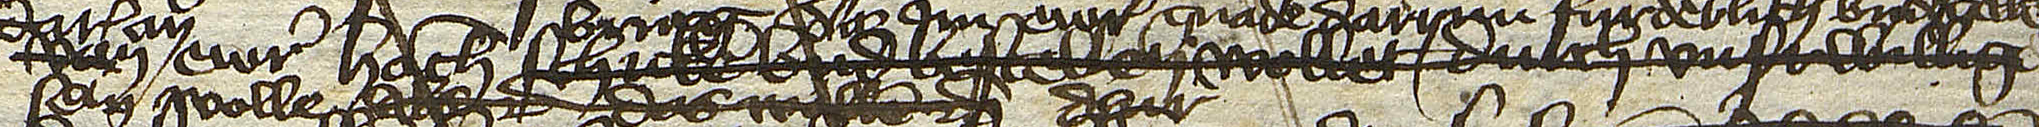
von ew*r hoch* ſchicke* vnd beſtellen wellet durch vnſ*r willige*
